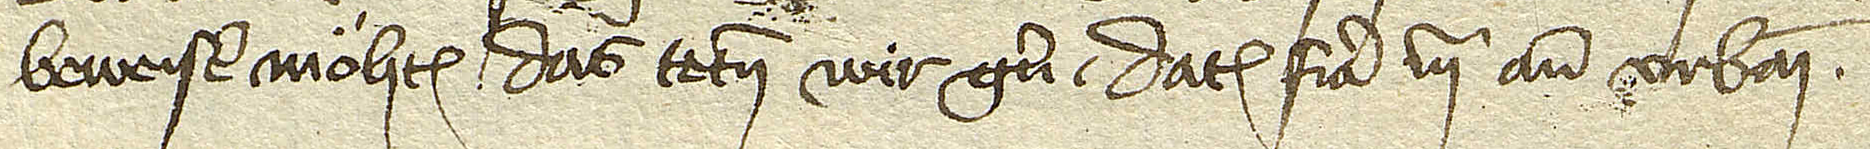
beweiſe* möht* / Das tetn* wir g*n / Dat* fia* iii* an* vrbai* .
